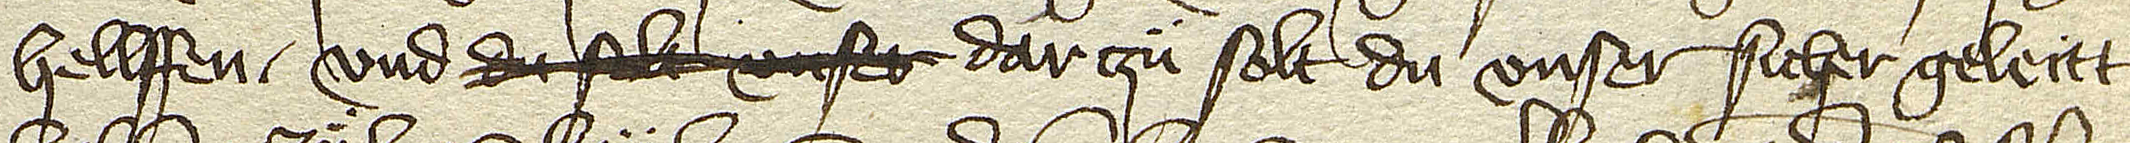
helffen / vnd du ſolt vnſer dar cʒü ſolt du vnſer ſicher geleitt
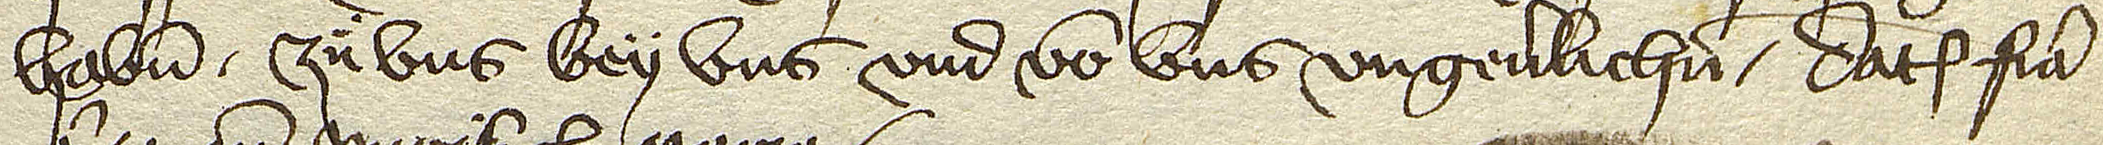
habn* / cʒü vns bey vns vnd vo* vns vngeu*lichn* / Dat* fia*
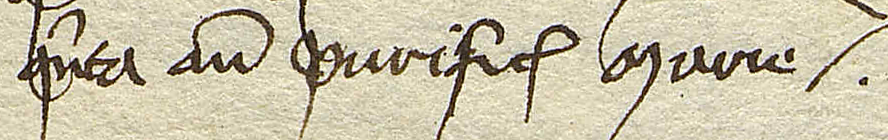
quta* an* Purific* Marie / .
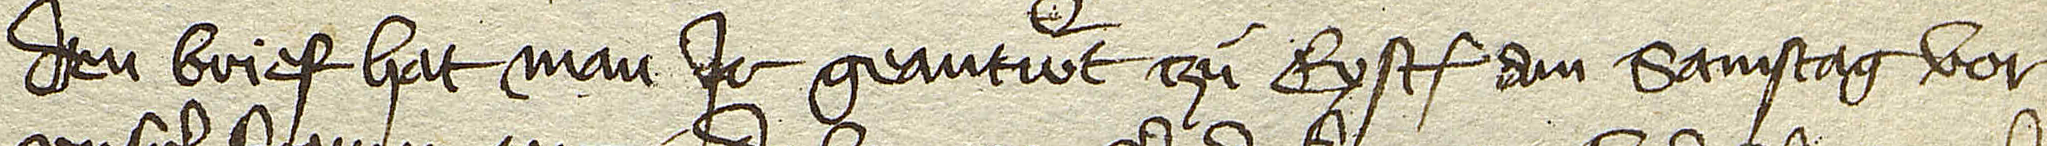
den brief hat man Ir geantw*t cʒü Eyſt* am Samſtag vor
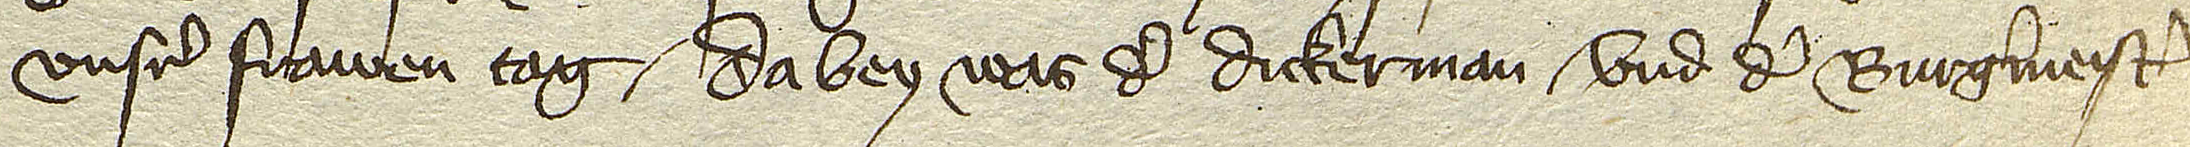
vnſr* frawen tag / Dabey was d* dickerman / vnd d* Burg*meiſt*
